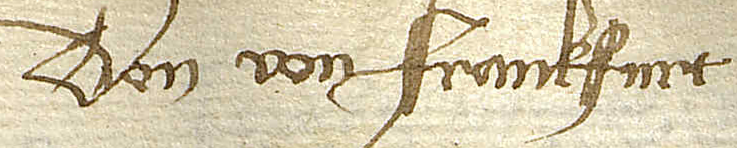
Den von Frankfurt
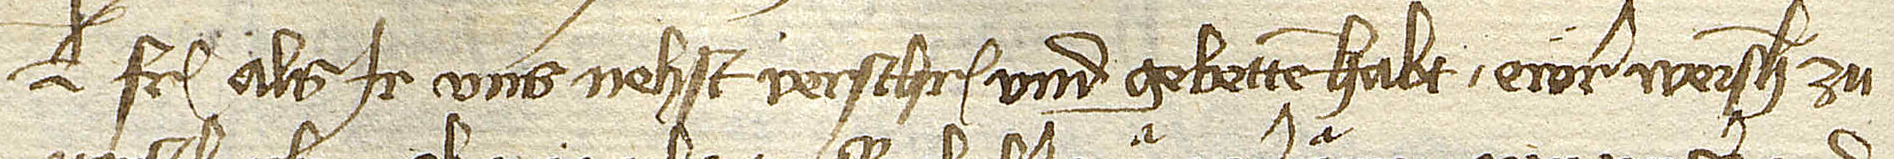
L* fr* als Ir vns nehſt verſchr* vnd gebette* habt / ew*r weiſh* ʒu
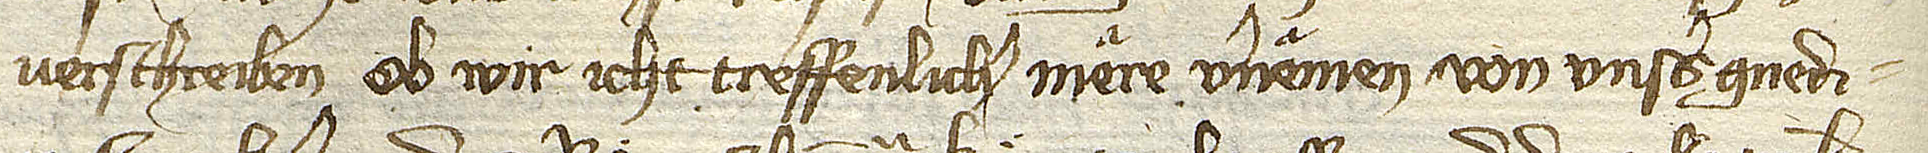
uerſchreiben Ob wir icht treffenlich* mëre v*nëmen von vnſ*s gnedi =
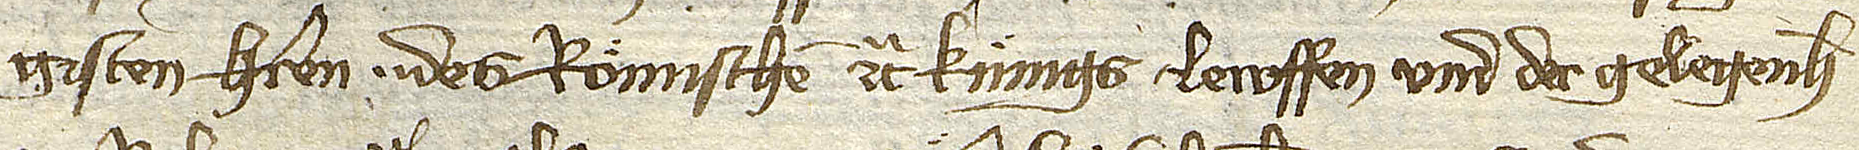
giſten h*ren ~ des Römiſche* ec* künigs / lewffen vnd der gelegenh*
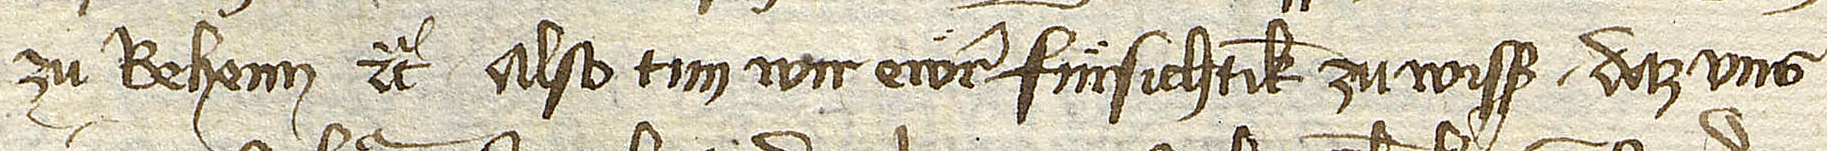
ʒu Beheim ec* Alſo tun wir ew*r fürſichtik* ʒu wiſſ* / daʒ vns
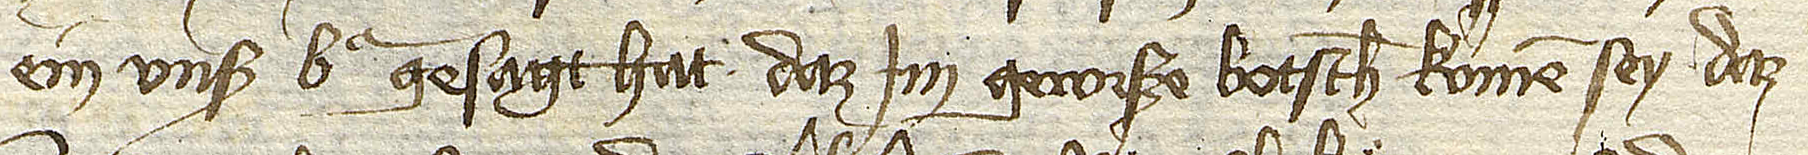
ein vnſ* b* geſagt hat . daʒ Im gewiſʒe botſch* kome* ſey daʒ
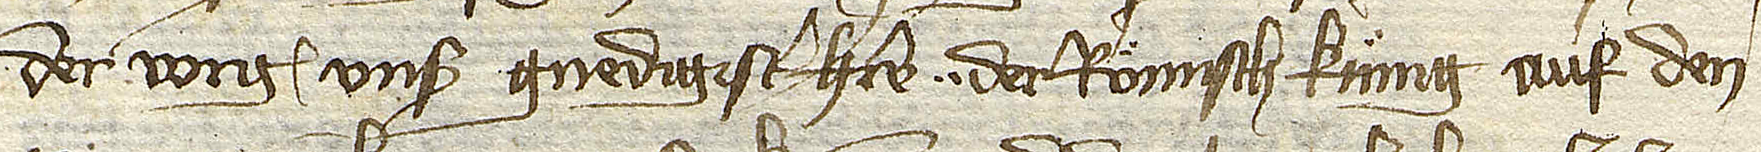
der vorg* vnſ* gnedigiſt* h*re ~ der Römiſch künig auf den
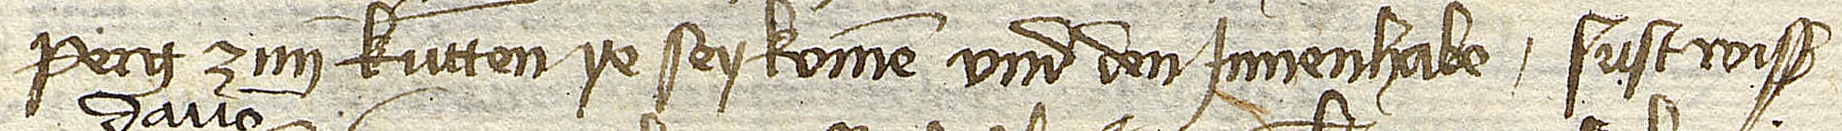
Perg ʒum kutten ye ſey kome* vnd den Innenhabe / ſuſt wiſſ*
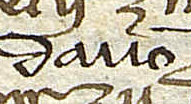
dauo*
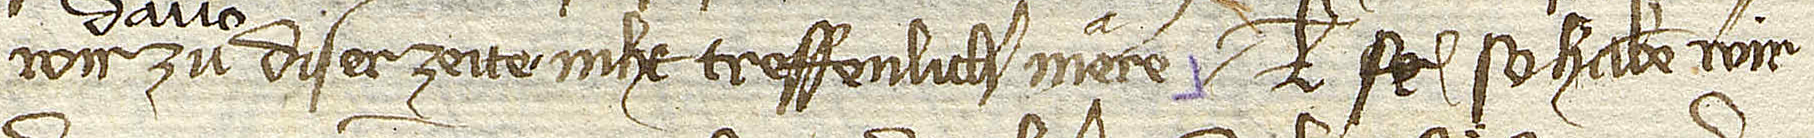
wir ʒu diſer ʒeite . niht treffenlich* mëre / L* fr* ſo habe* wir
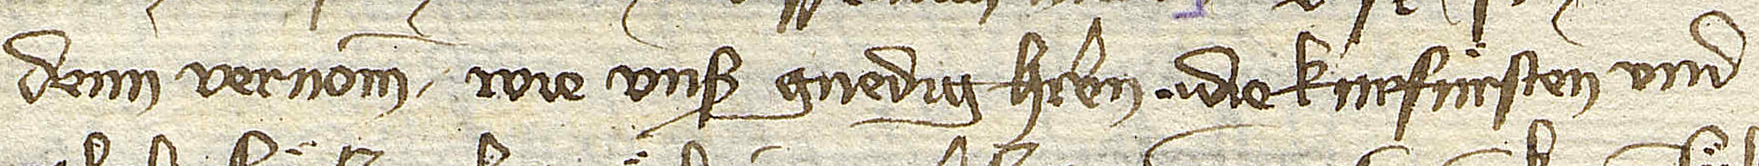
denn vernom* / wie vnſ* gnedig h*ren ~ die kurfürſten vnd
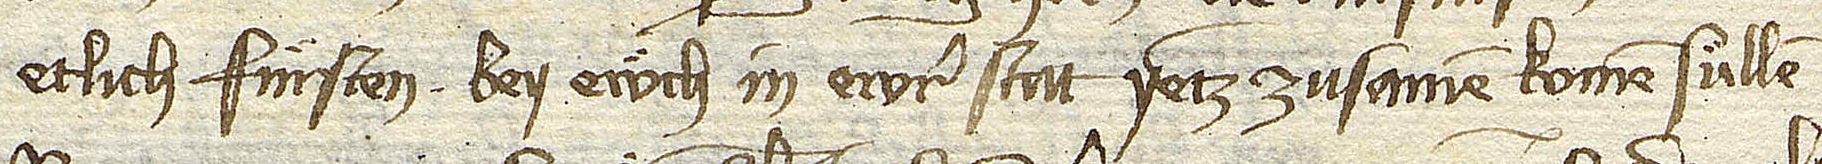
etlich fürſten . bey ewch in ew*r ſtat yecʒ* ʒuſame* kome* ſülle*
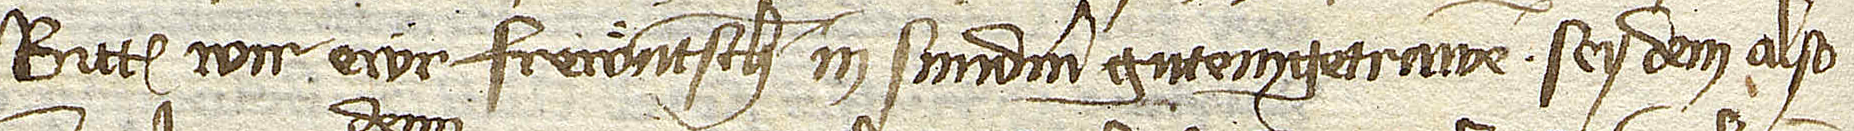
Bitt* wir ewr frewntſch* in ſund*m gutem getrawe* . ſey dem alſo
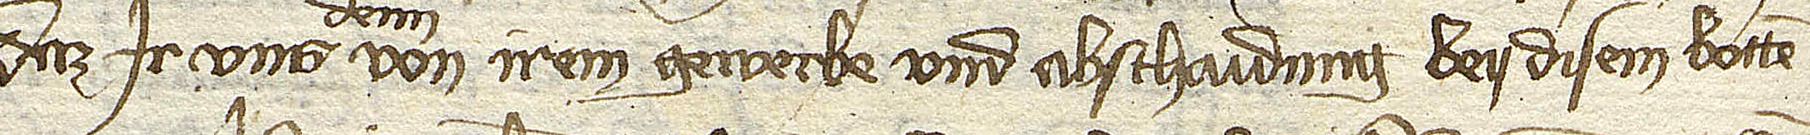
Daʒ Ir vns von irem gewerbe vnd abſchaidung bey diſem botte*
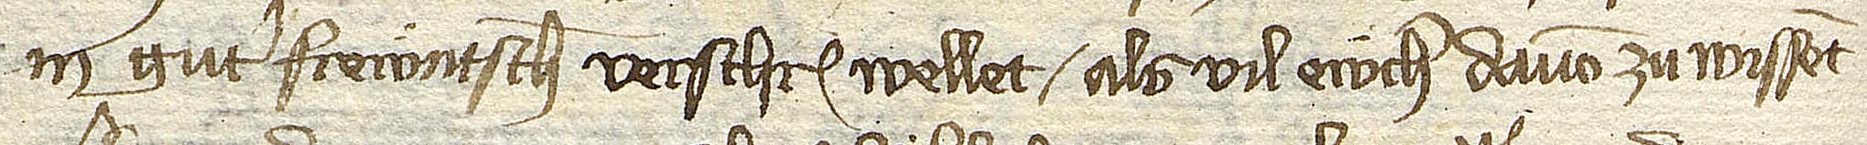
in gut* frewntſch* verſchr* wellet / als vil ewch dauo* ʒu wiſſe*t
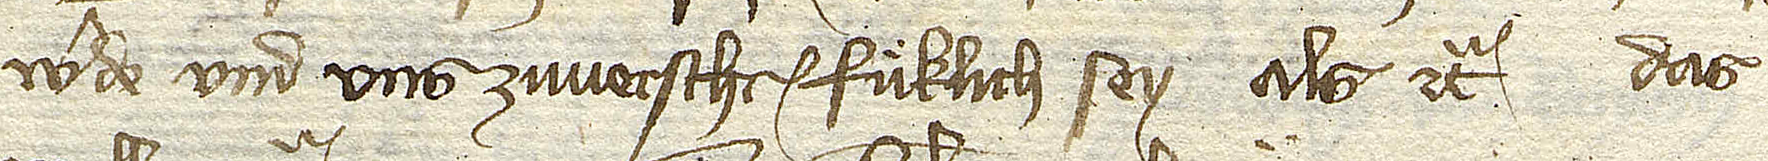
w*de vnd vns ʒuuerſchr* füklich ſey als ec* . das
